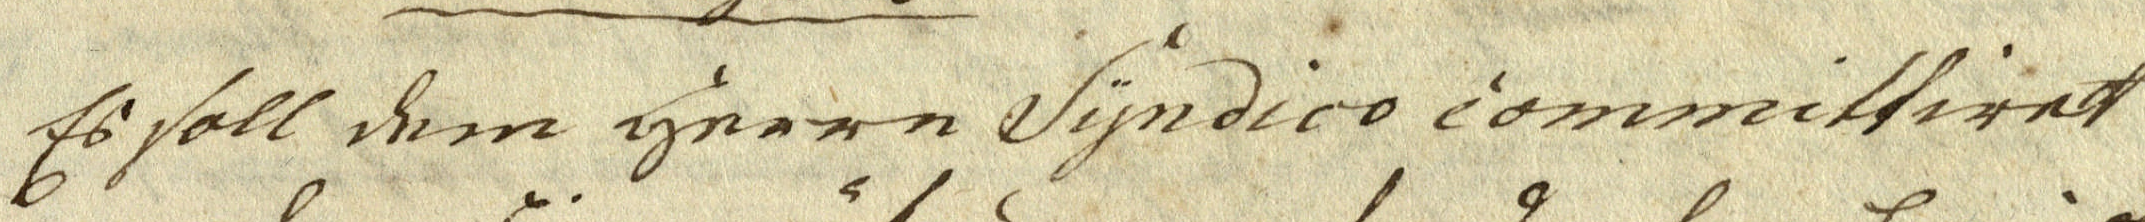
Es soll dem Herrn Sÿndico committiret
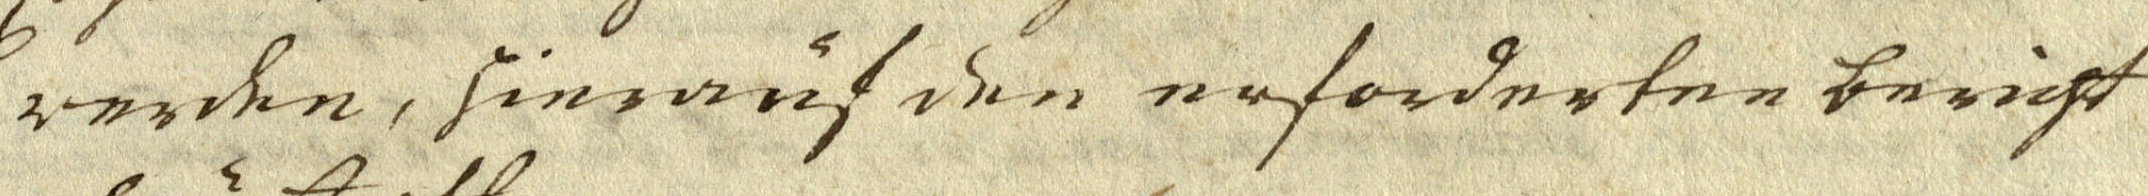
werden, hierauf den erforderten Bericht
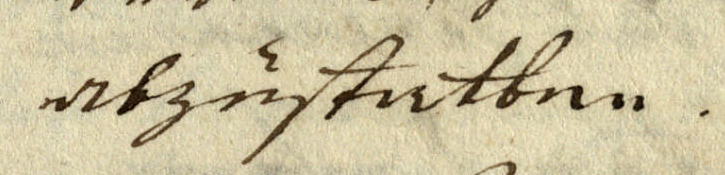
abzustatten.
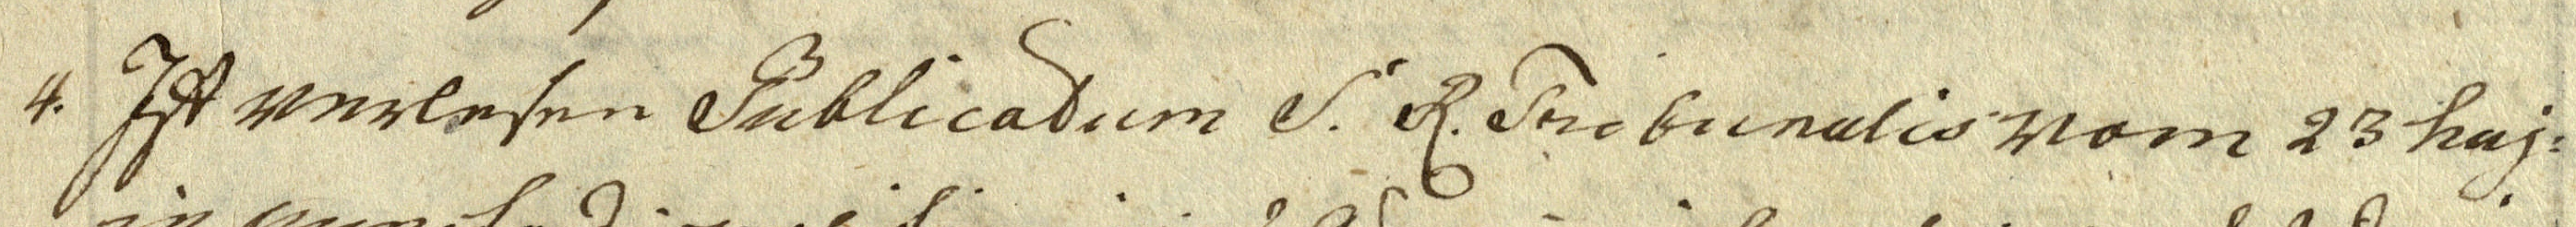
4. Ist verlesen Publicatum S. R. Tribunalis vom 23. huj.
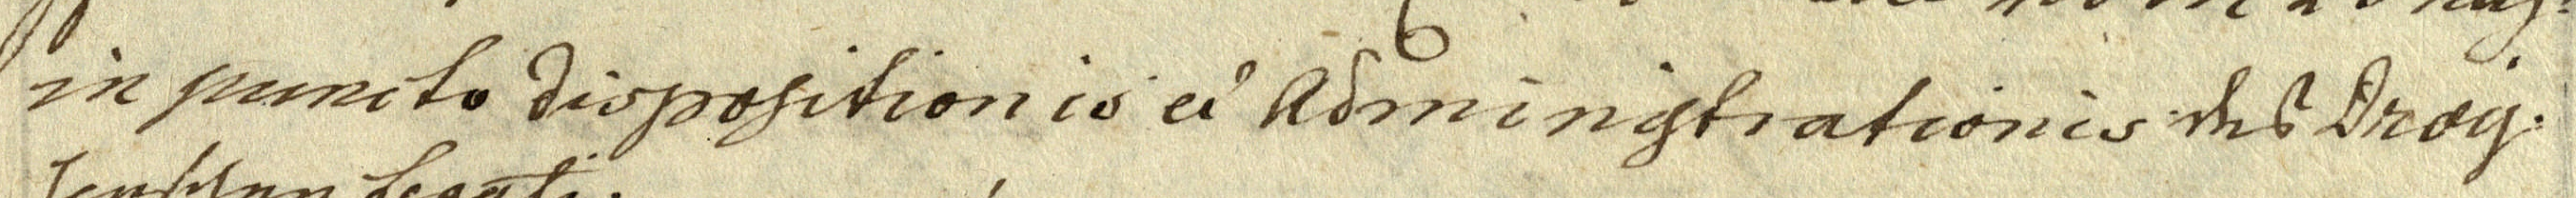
in puncto dispositionis et Administrationis des Droÿ¬
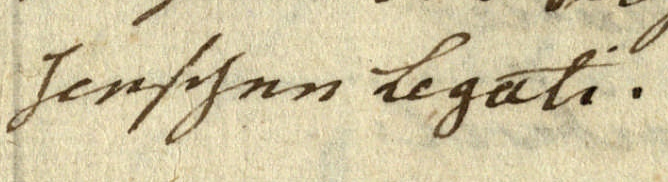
senschen Legati.
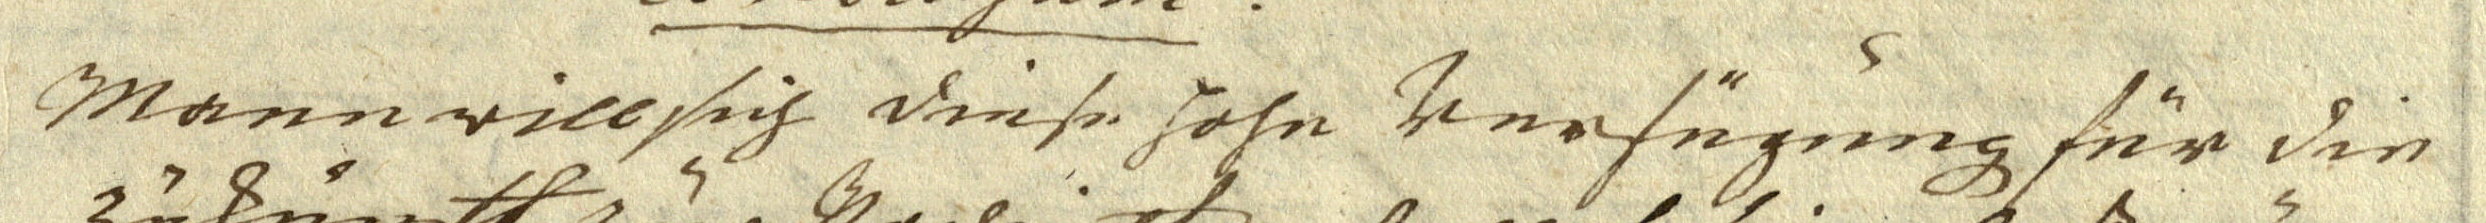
Mann will sich diese hohe Verfügung für die
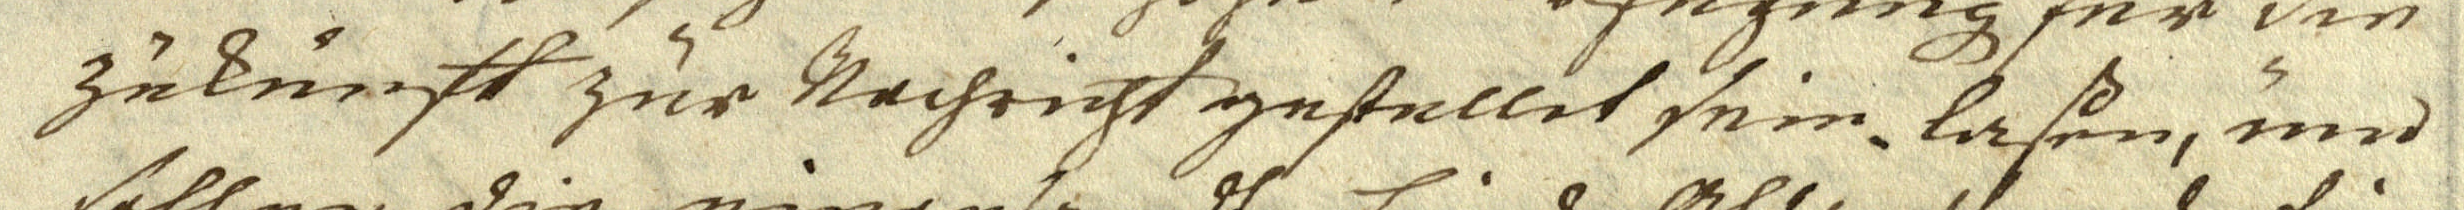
Zukunft zur Nachricht gestellet sein laßen, und
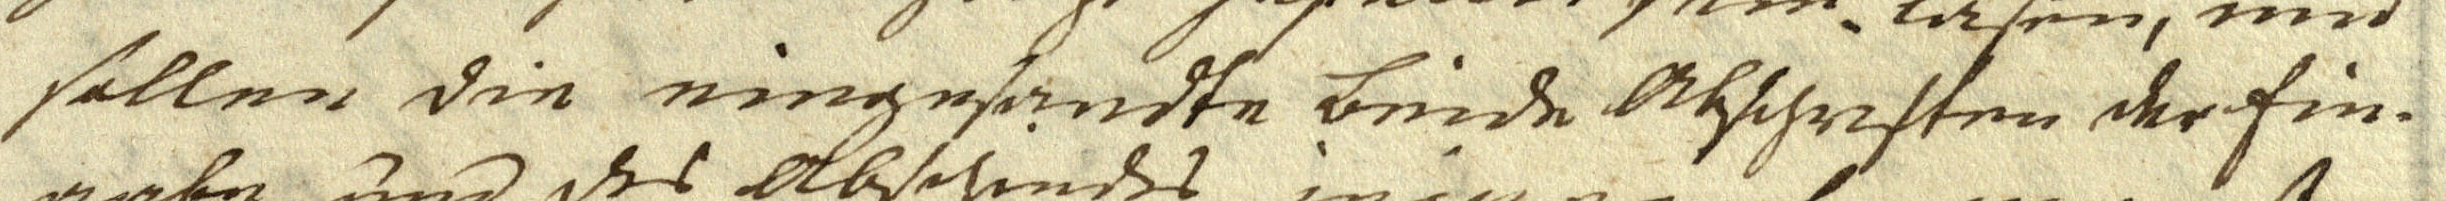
sollen den eingesandte beide Abschriften der Ein¬
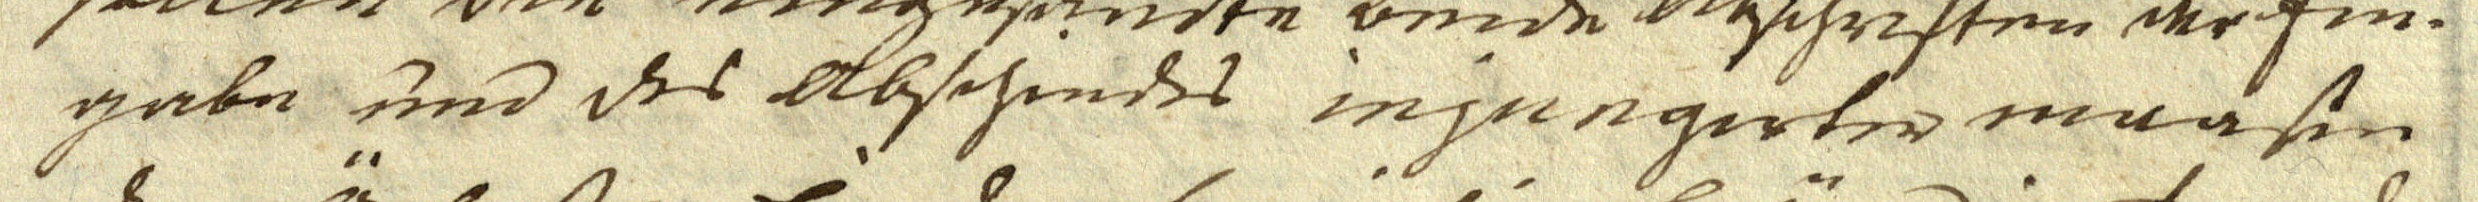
gabe und des Abschiedes injungirter maaßen
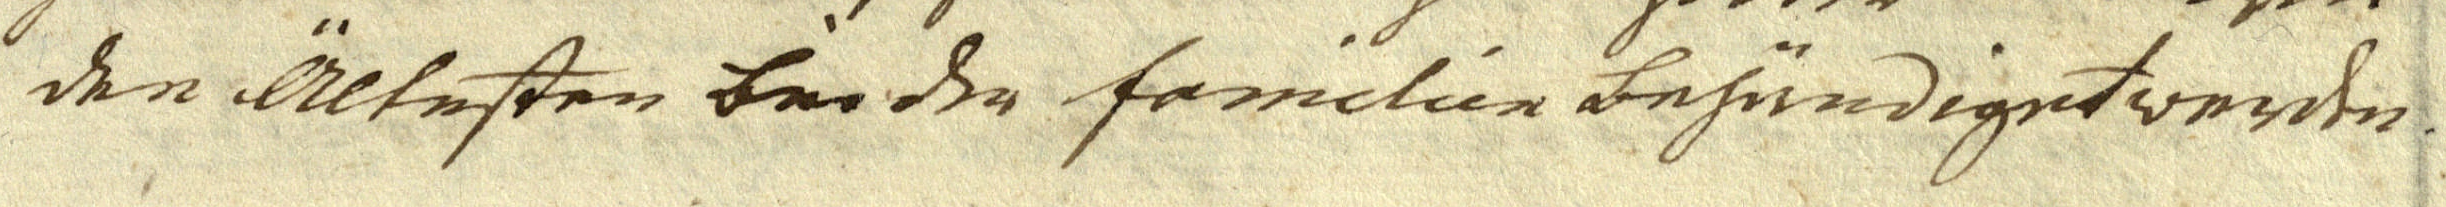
den Ältesten beider Familien behändiget werden.
